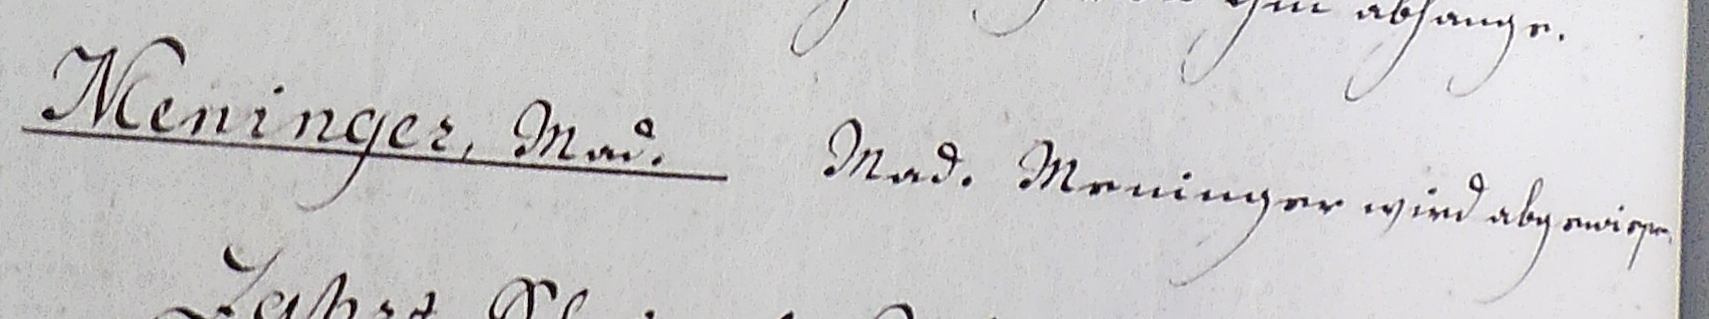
Meninger, Mad. Mad. Meninger wird abgewiesen.
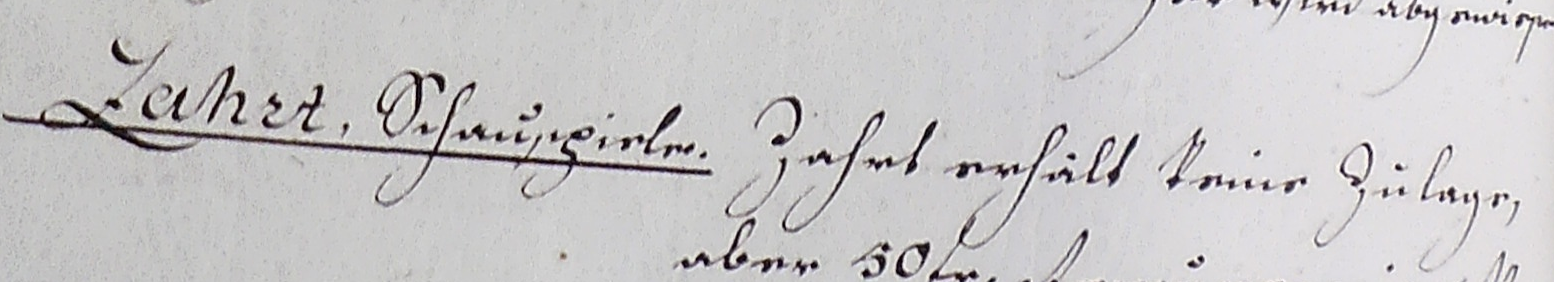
Zahrt, Schauspieler. Zahrt erhält keine Zulage,
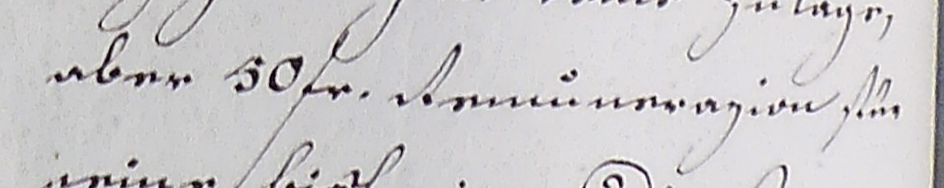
aber 50fr. Remunerazion für
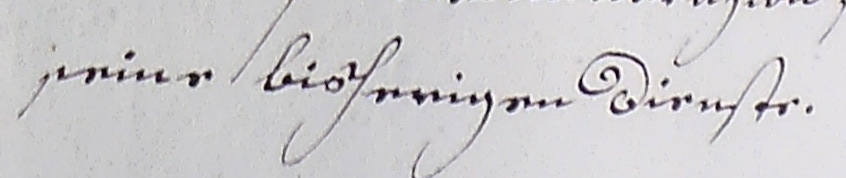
seine bisherigen Dienste.
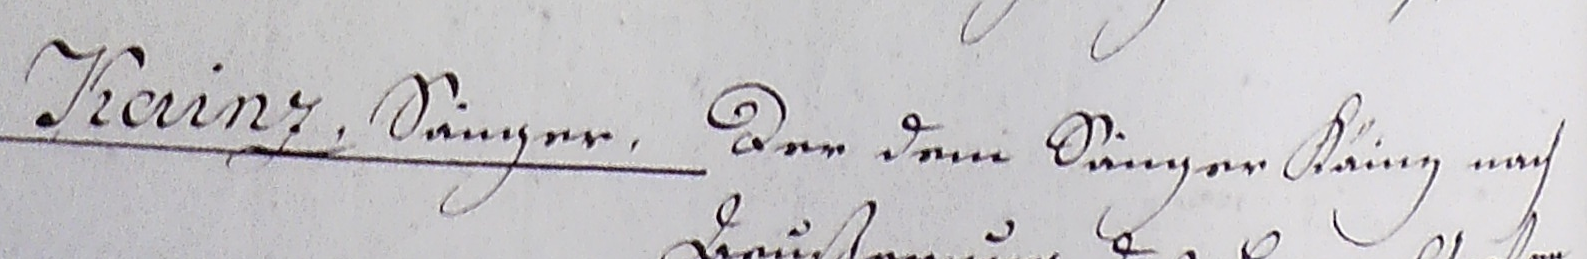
Kainz, Sänger. Der dem Sänger Kainz nach
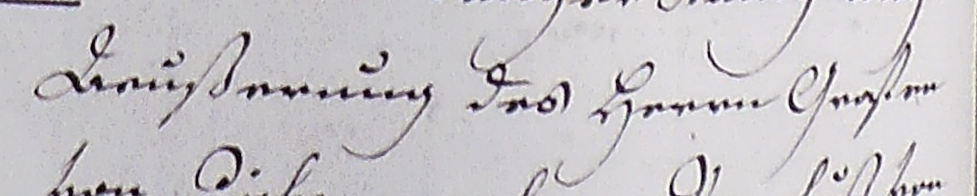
Aeußerung des Herrn Grafen
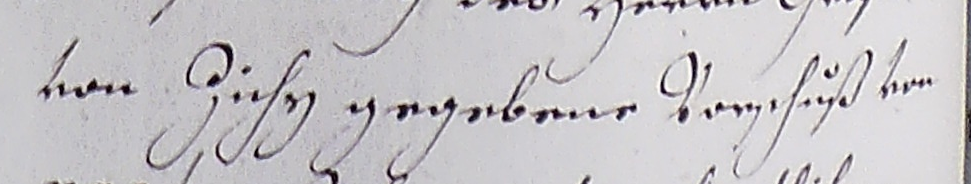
von Zichy gegebene Vorschuß von
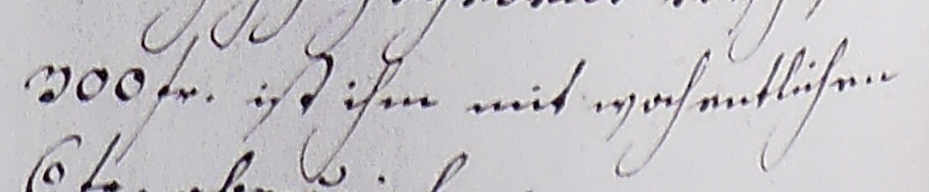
300fr. ist ihm mit wochentlichen
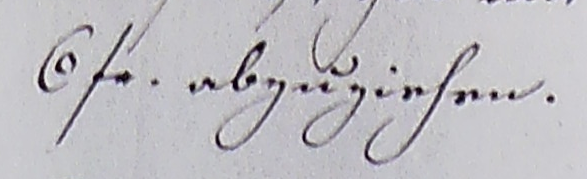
6fr.abzuziehen.
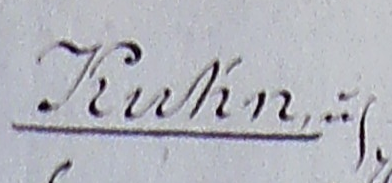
Kuhn, u
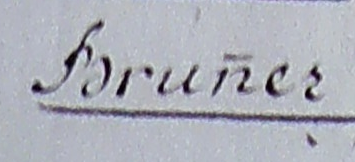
Brun̅er
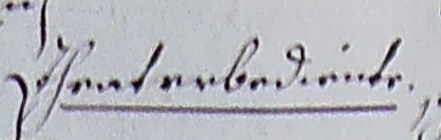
Theaterbediente.
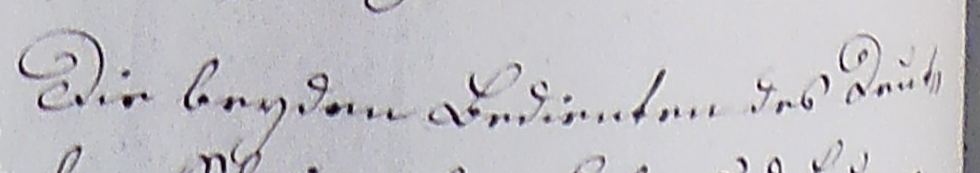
Die beyden Bedienten das Deut¬
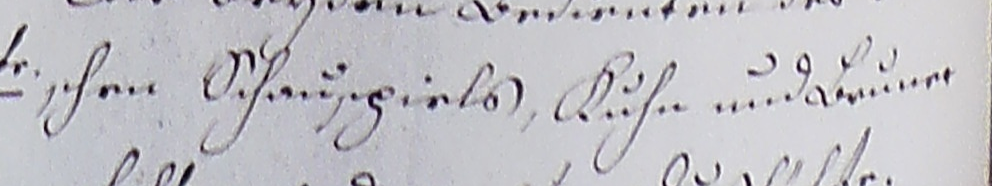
schen Schauspiels, Kuhn und Brun̅er
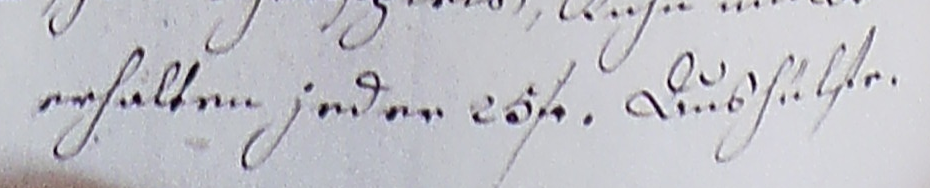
erhalten jeder 25fr. Aushülfe.
